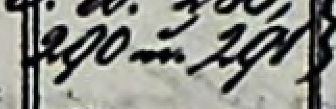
290 im 2291
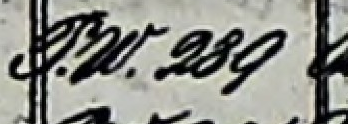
P.W. 289
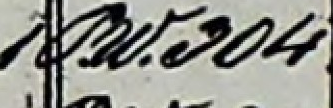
P.W. 304
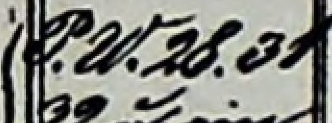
P.W. 28. 31
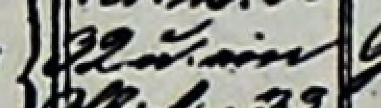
32 u. ein
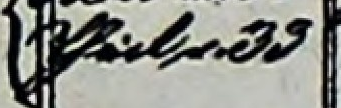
Theil v. 33
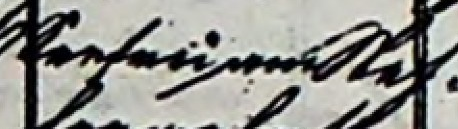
Senfrei am Stef.
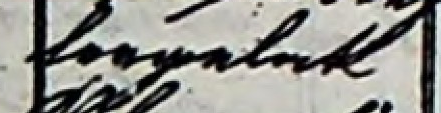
lengelak
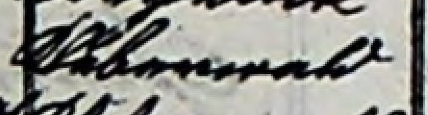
Kleberwald
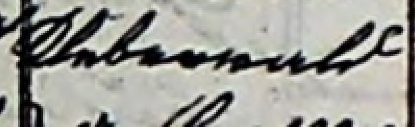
Kleberwald
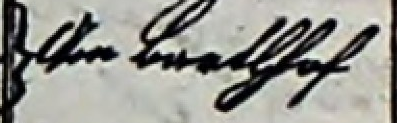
An Bratlhof
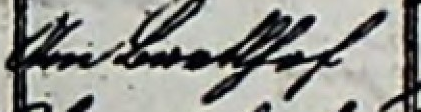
An Bratlhof
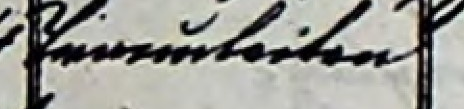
Traunleiten
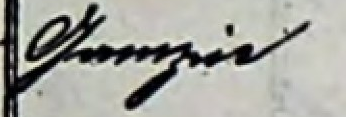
Ganzin
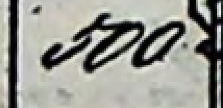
500
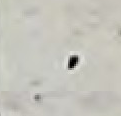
.
